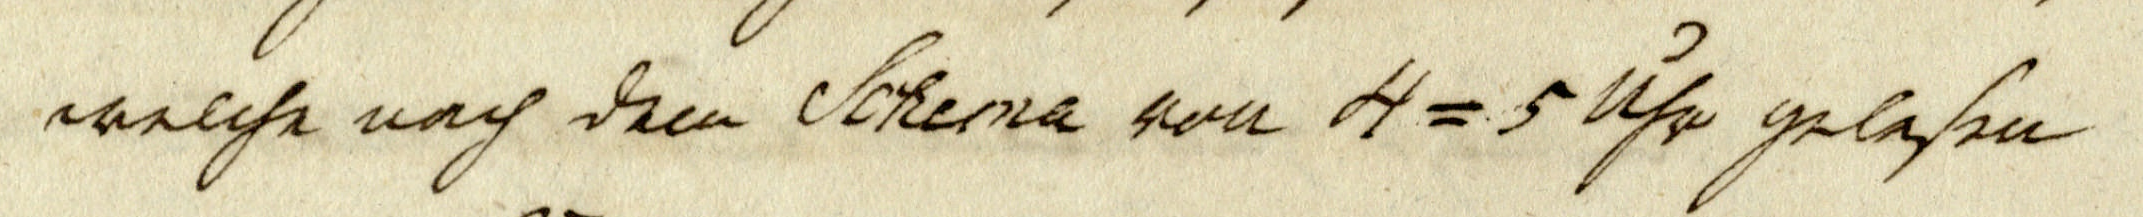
welche nach dem Schema von 4-5 Uhr gelesen
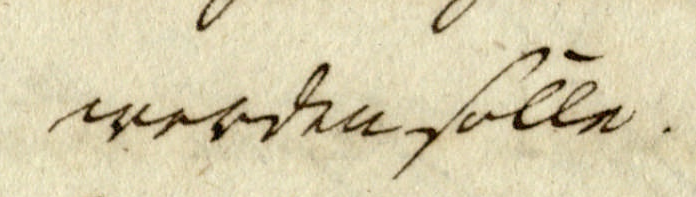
werden solle.
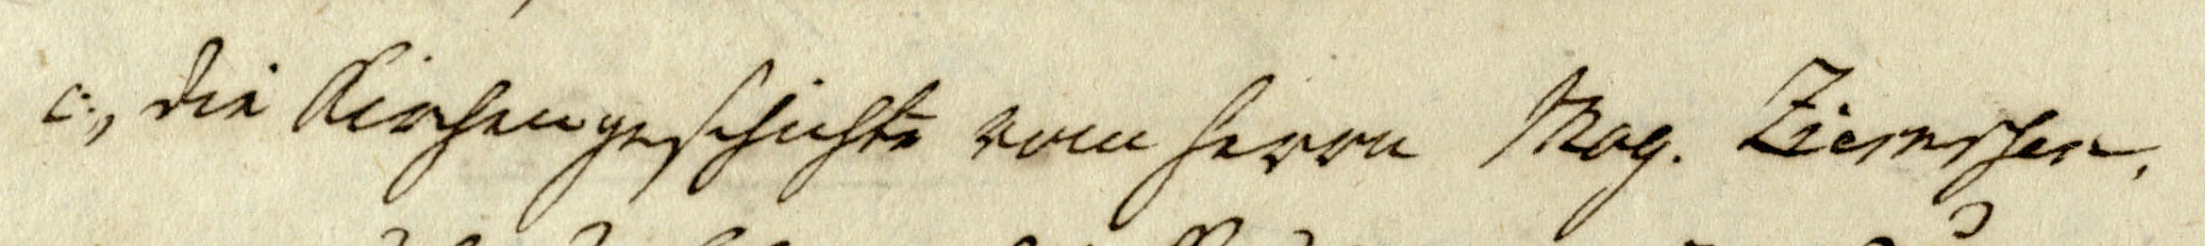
c., die Kirchengeschichte vom herrn Mag. Ziemssen,
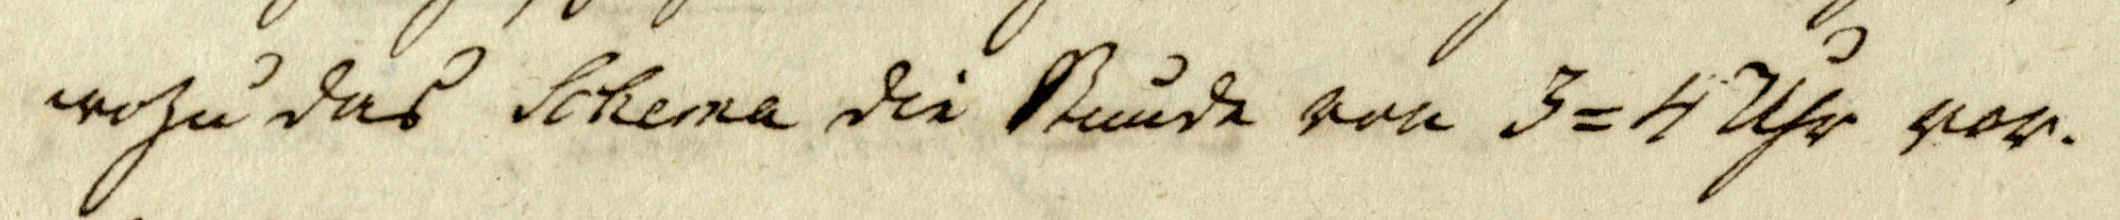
wozu das Schema die Stunde von 3-4 Uhr vor¬
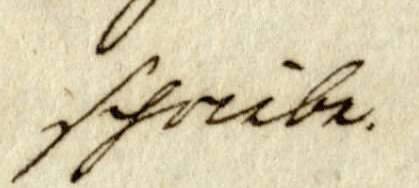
schreibe.
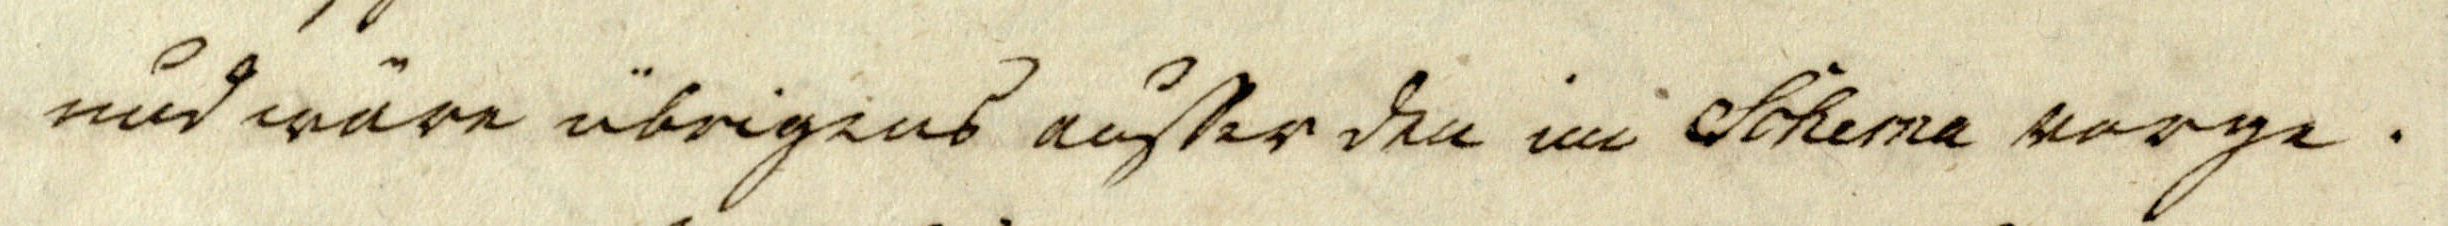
und wäre übrigens außer den im Schema vorge¬
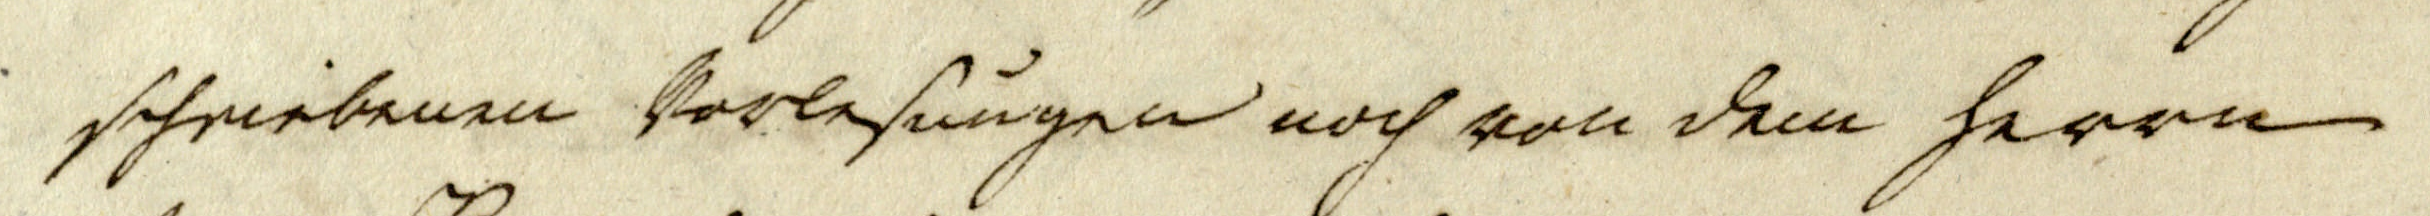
schriebenen Vorlesungen noch von dem herrn
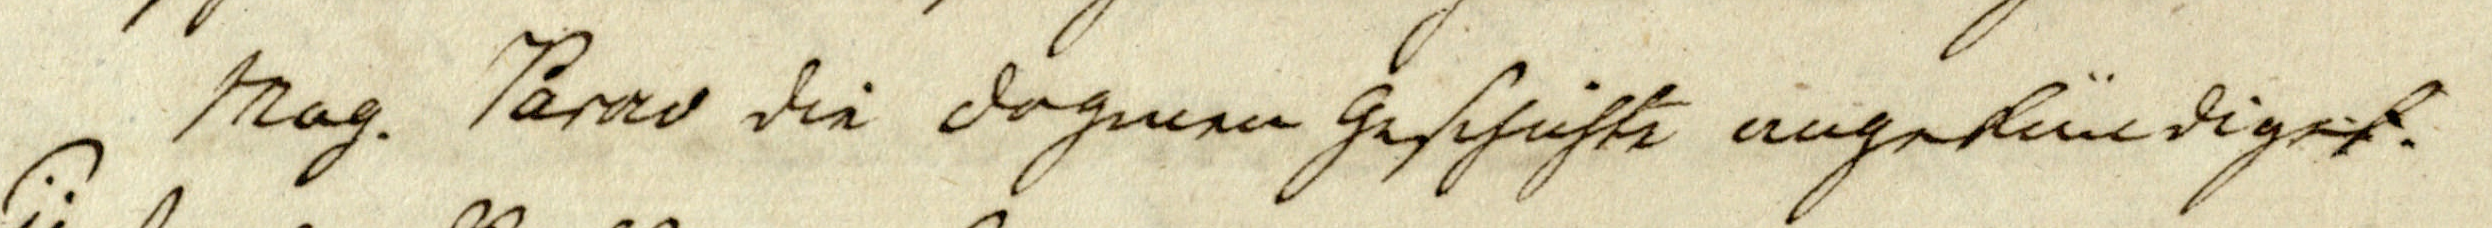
Mag. Parow die Dogmen Geschichte angekündiget.
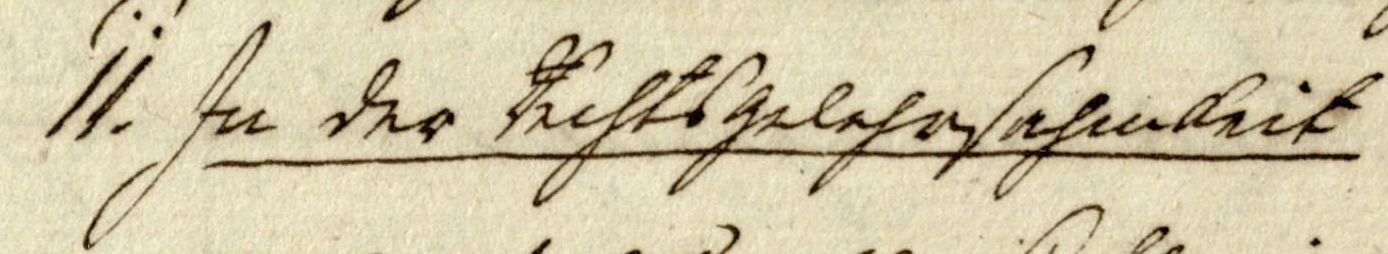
II. In der Rechtsgelehrsahmkeit
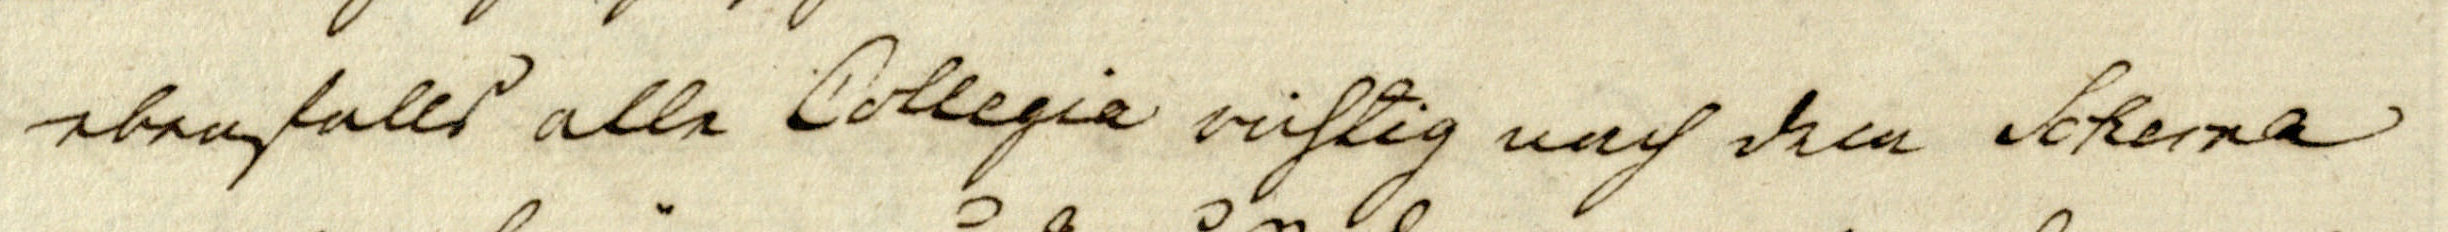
ebenfalls alle Collegia richtig nach dem Schema
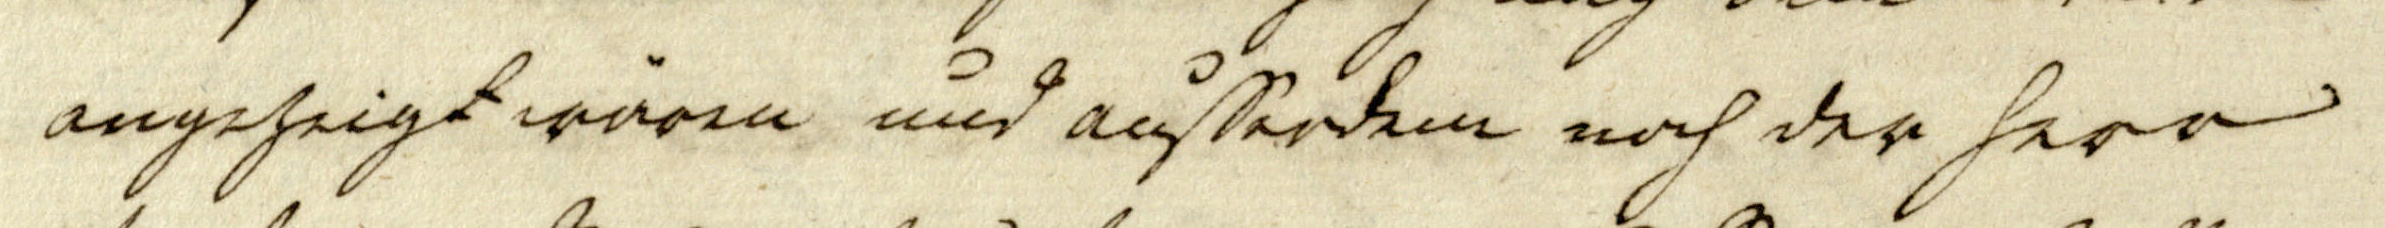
angezeigt wären und ausserdem noch der herr
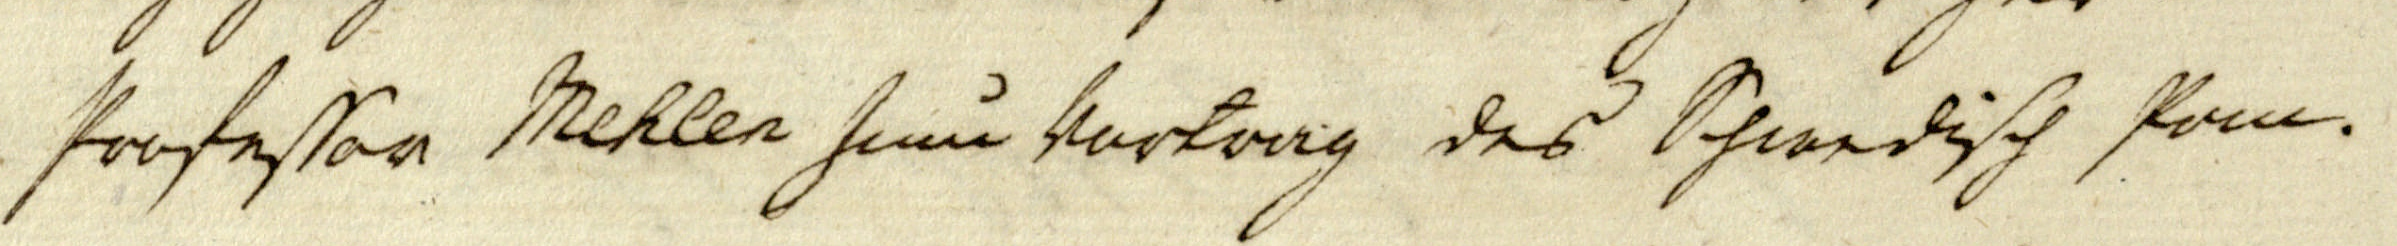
Professor Mehlen zum Vortrag des Schwedisch Pom¬
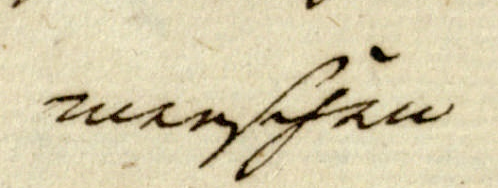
merschen
